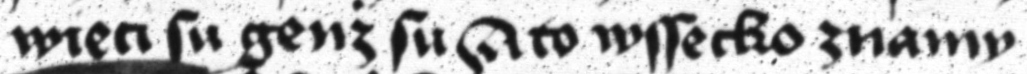wieci ſu genż ſu A to wſſecko znamy
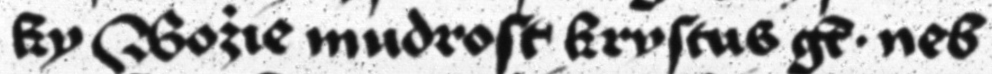ky Bożíe mudroſt kryſtus ḡt. neb
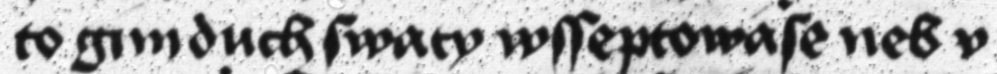to gim duch ſwaty wſſeptowáẛe neb v
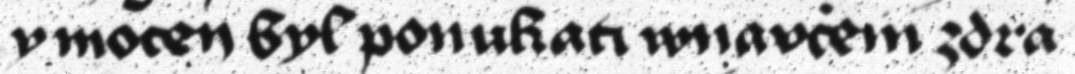y mocen byl ponukati wnavċení zdra
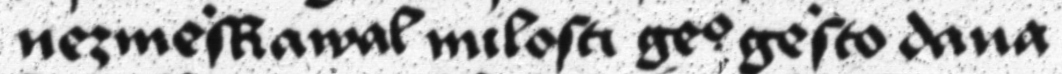nezmeẛkáwal milostí ge° geẛto dana
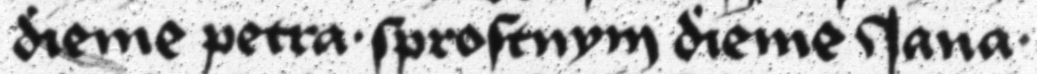ḋíeme petra. ſprostnym ḋíeme Iana.
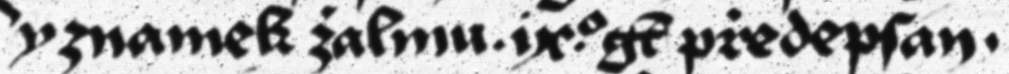y znamek żalmu yx° ḡt pṙedepſán.
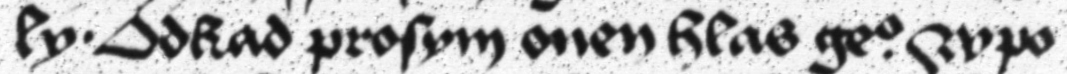ly. Odkad proſym onen hlas ge° Wpo
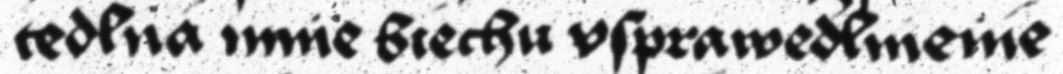tedlná mnie bíechu vſprawedlniṅíe
